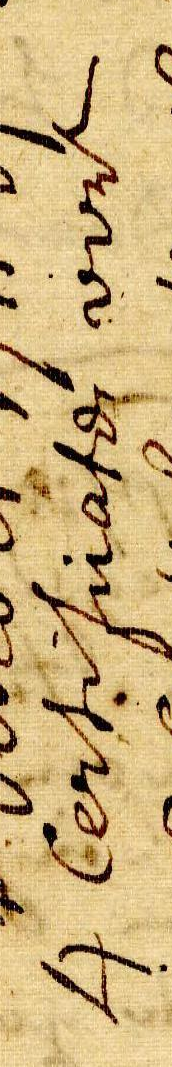4 Certificates viz^t
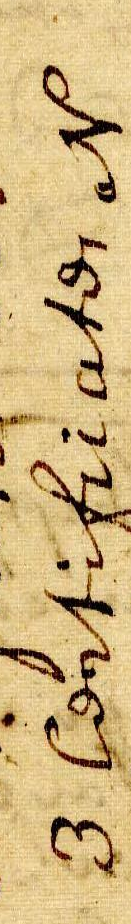2 Certificates N^o
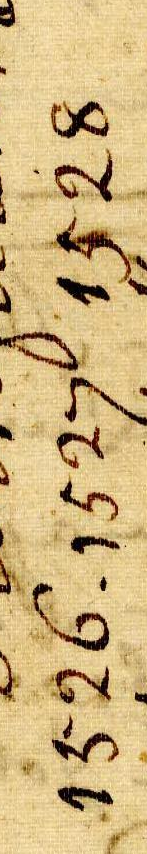1526.1527 1528
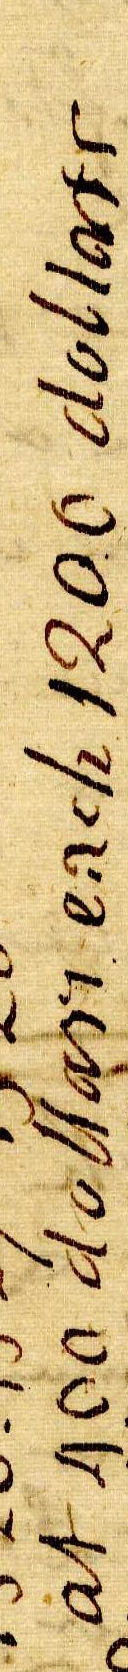at 400 dollars each 1200 dollars
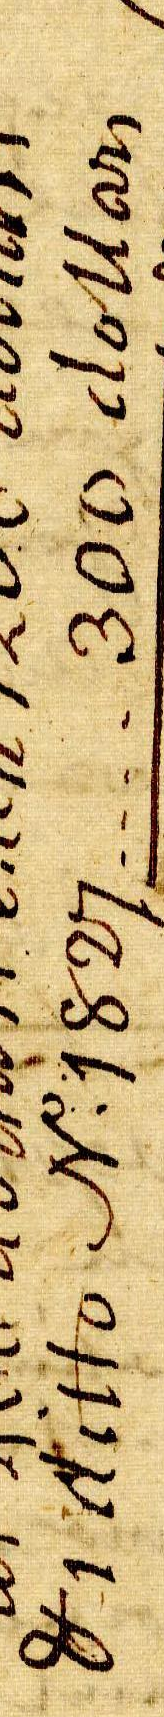& 1 ditto N^o. 1827 .... 300 dollars
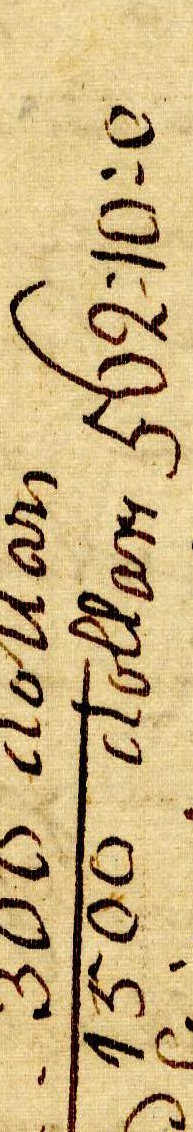1500 dollars 562:10:0
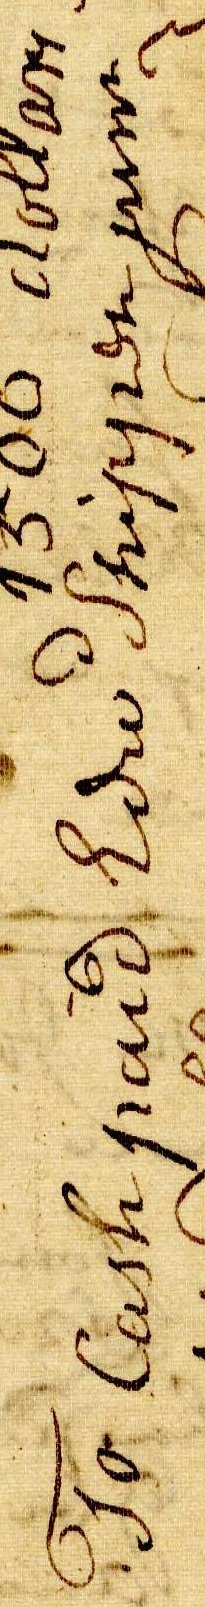To Cash paid Edw^d Shippen jun^r
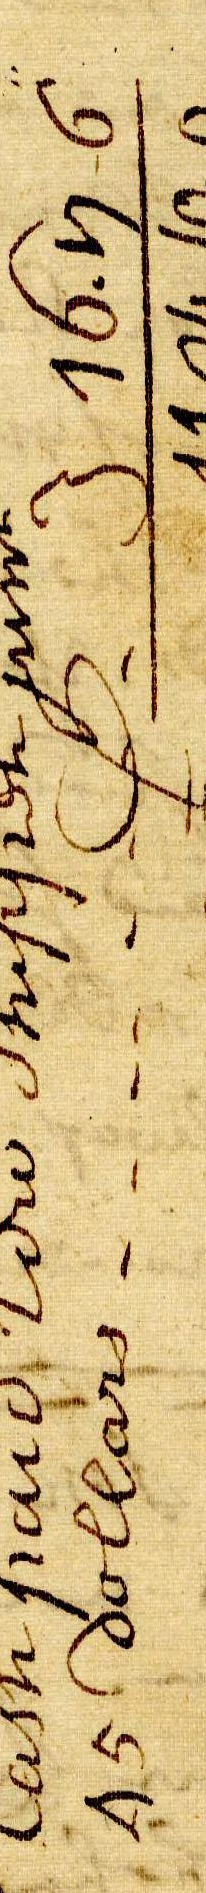45 dollars--------£316.17.6
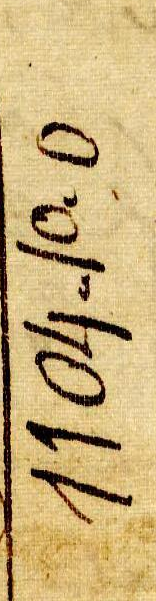1104..10.0
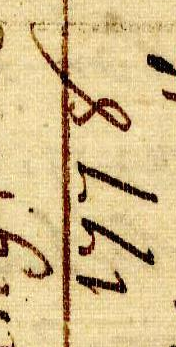1778
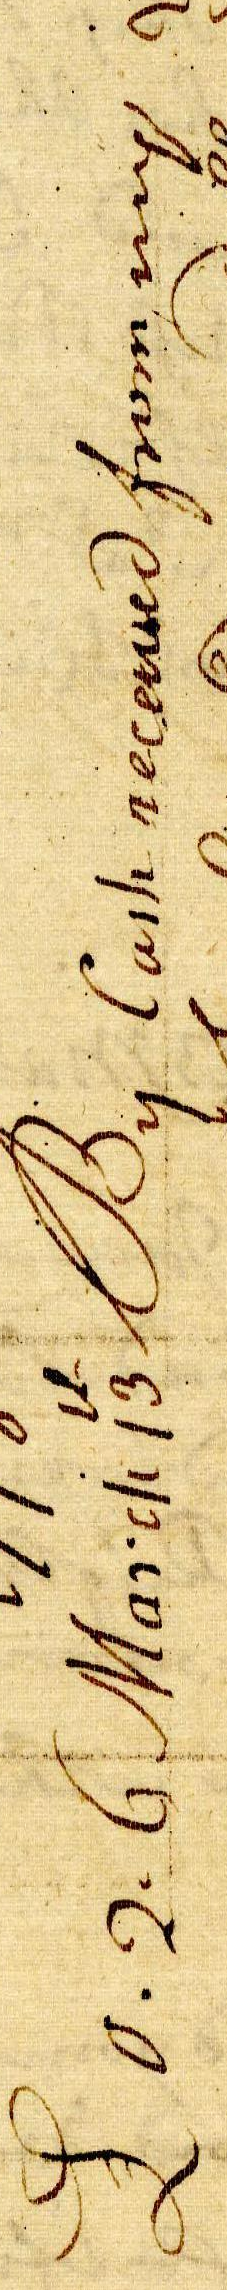£0.2.6 March 13^th By Cash received from my
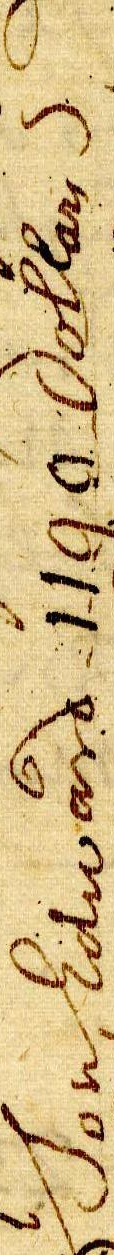Son Edward 1190 dollars
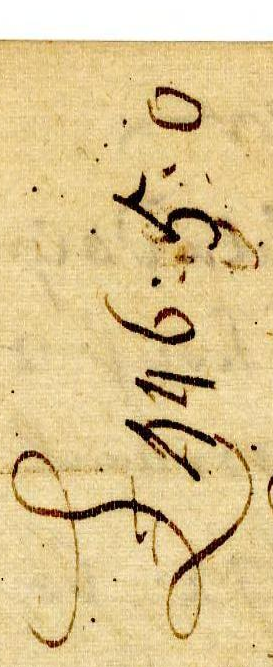£446:5:0
